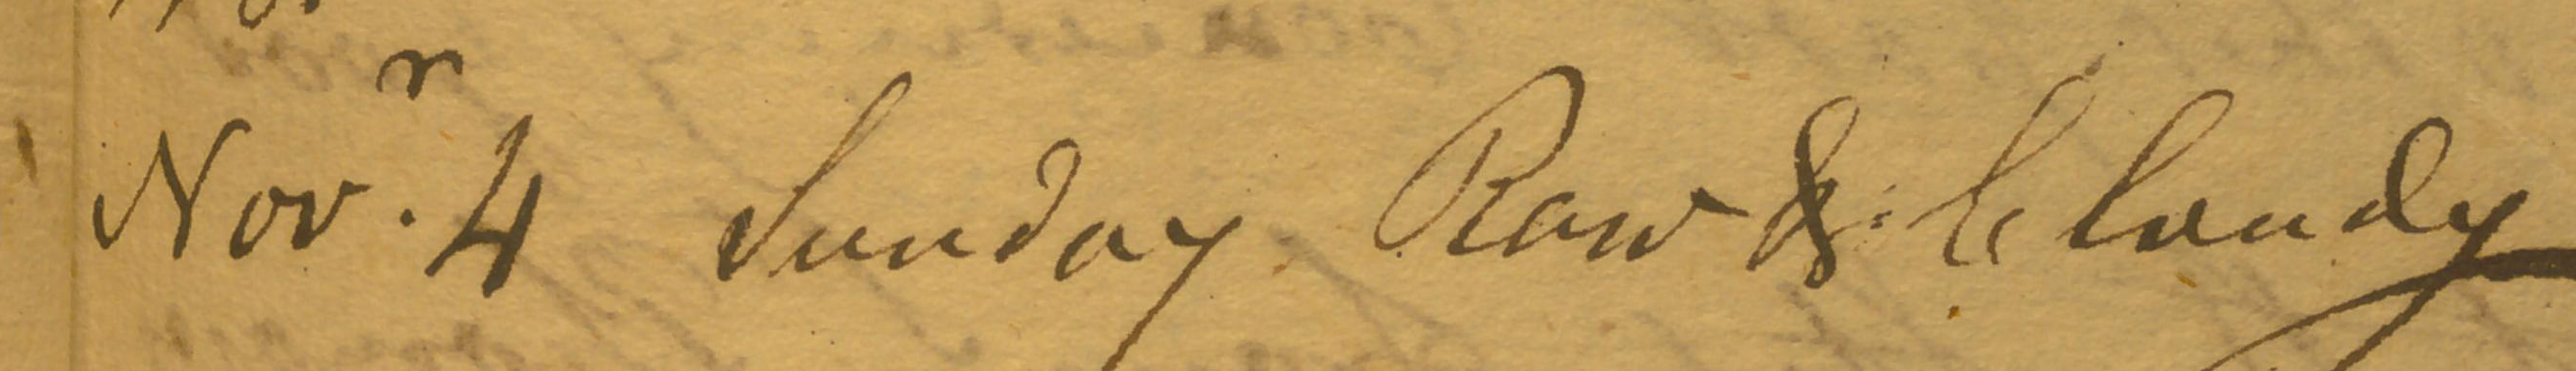Nov^r. 4 Sunday. Raw &. Cluudy
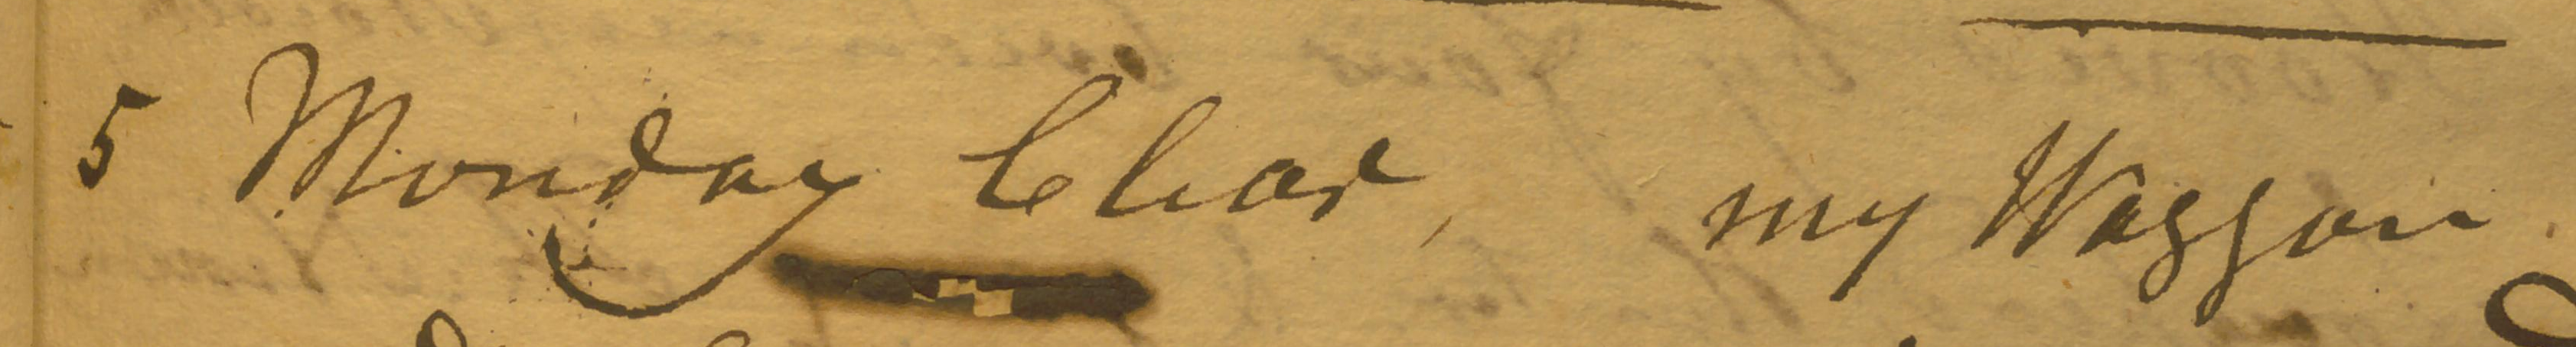5 Monday Clear, my Waggon
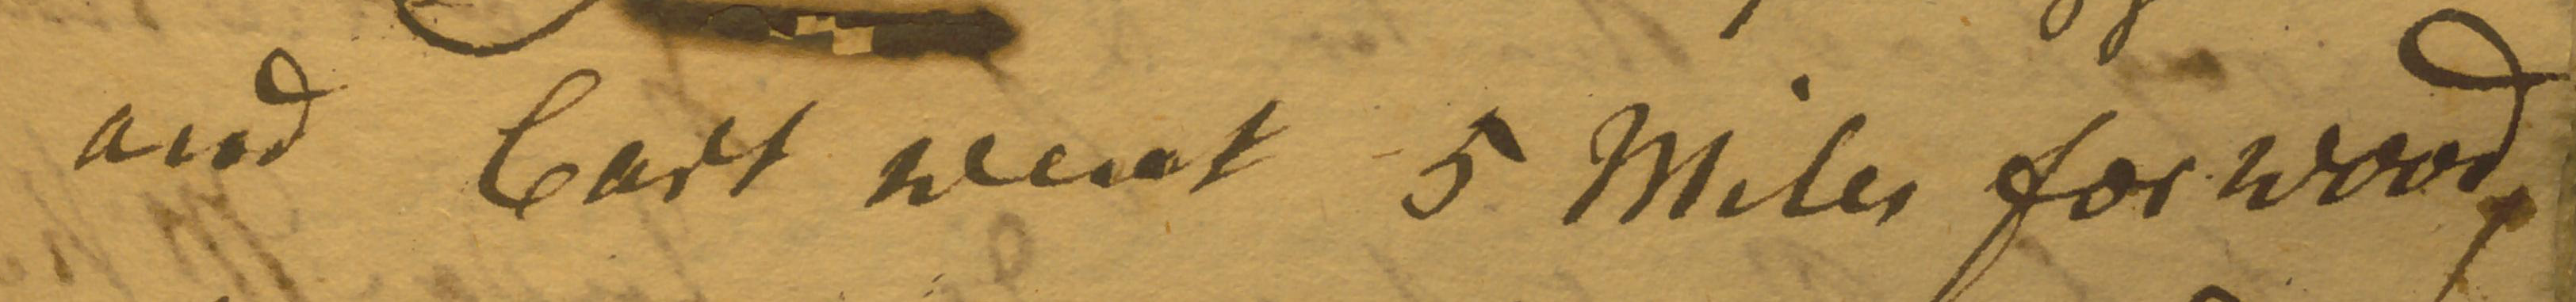and Cart went 5 Miles for wood
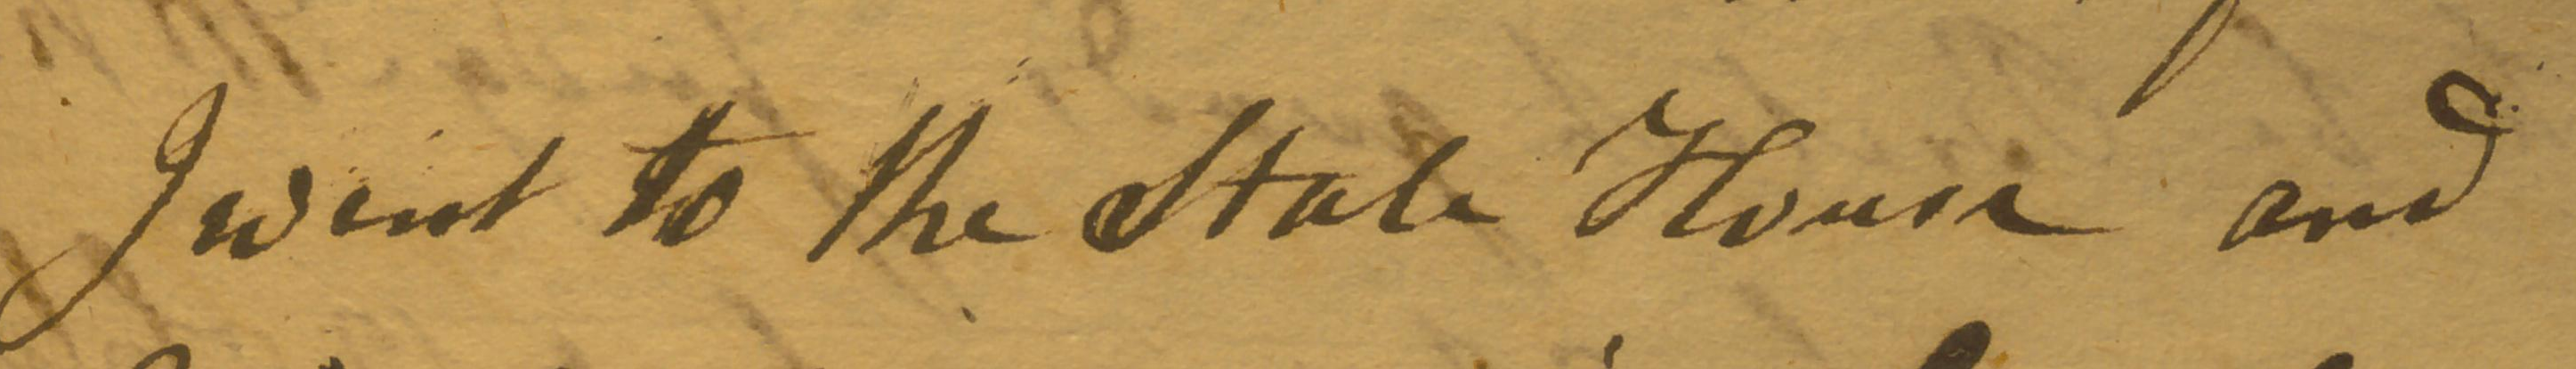I went to the State House and
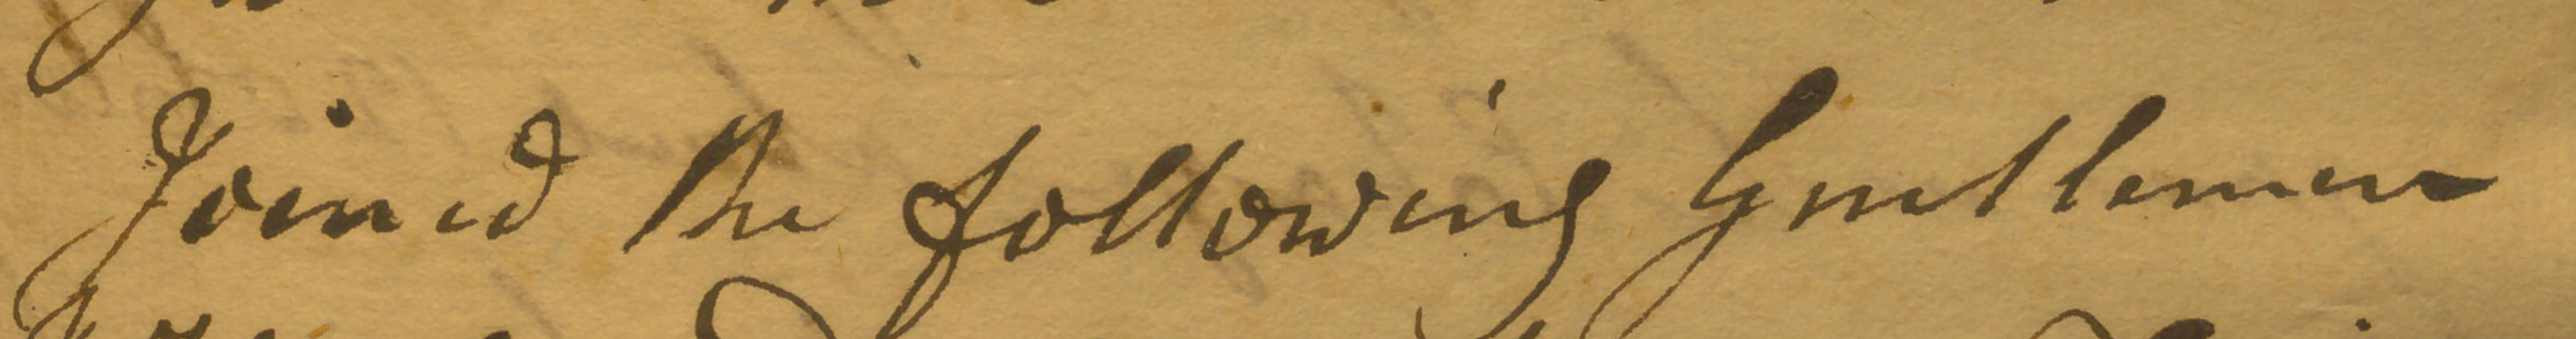Joined the following Gentlemin
